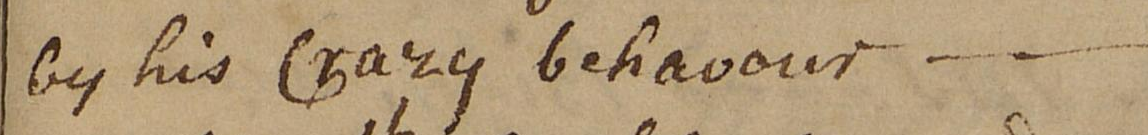by his Crazy behavour-
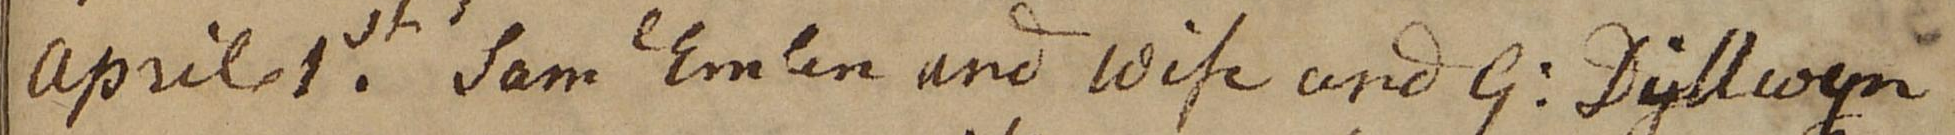April 1^st. Sam^l Emlen and Wife and G: Dyllwyn
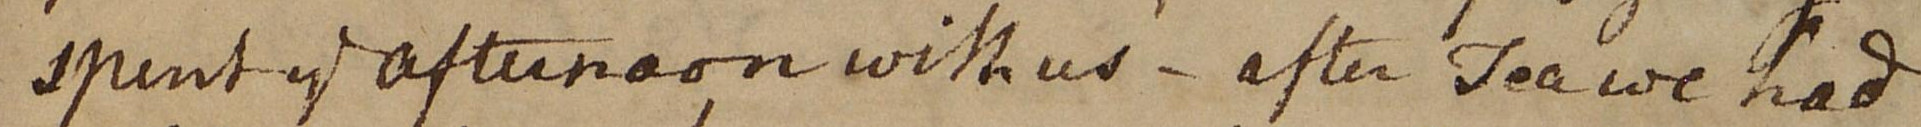spint y^e afternoon with us- after Tea we had
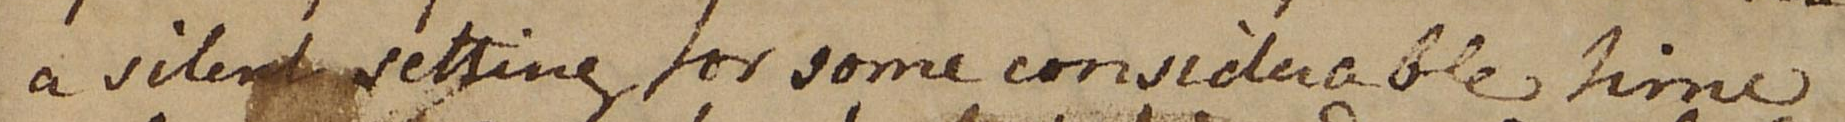a silent setting for some considerable time
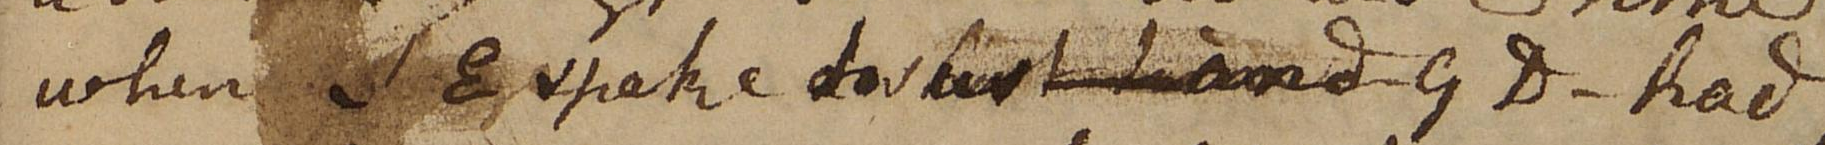when S E spake to us [__] and GD- had
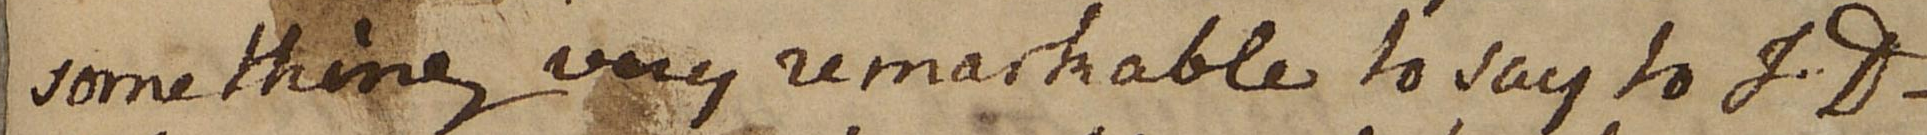something very remarkable to say to ID-
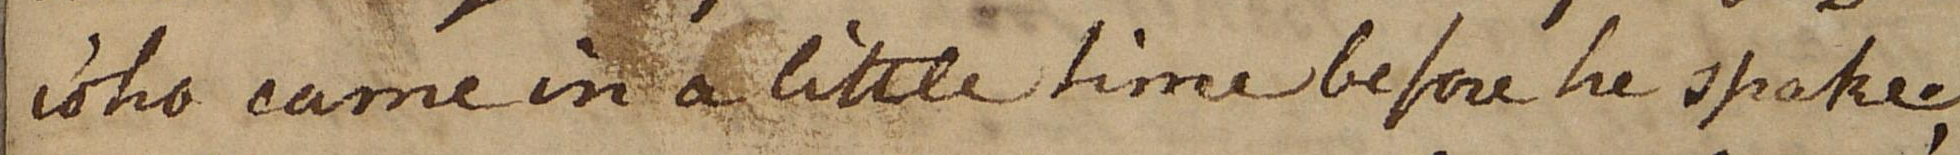who came in a little time before he spake;
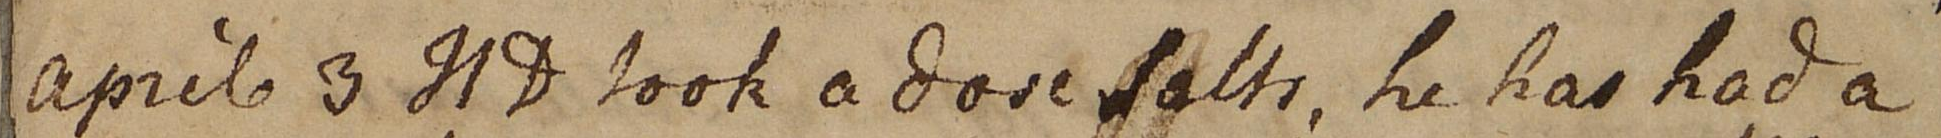April 3 HD took a dose salts, he has had a
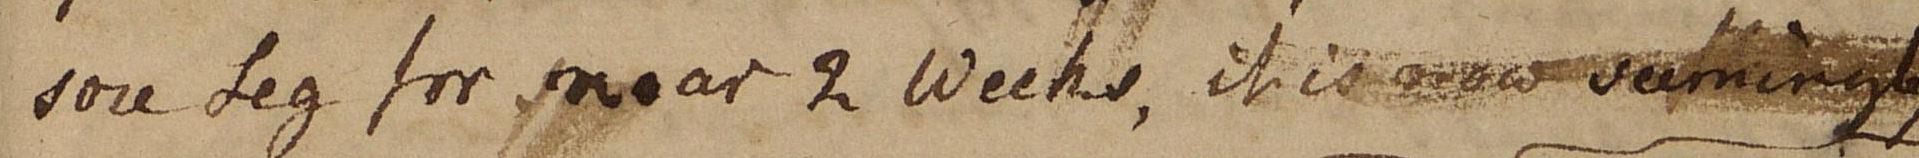sore Leg for near 2 Weeks, it is [now] seemingly
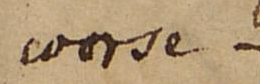worse -
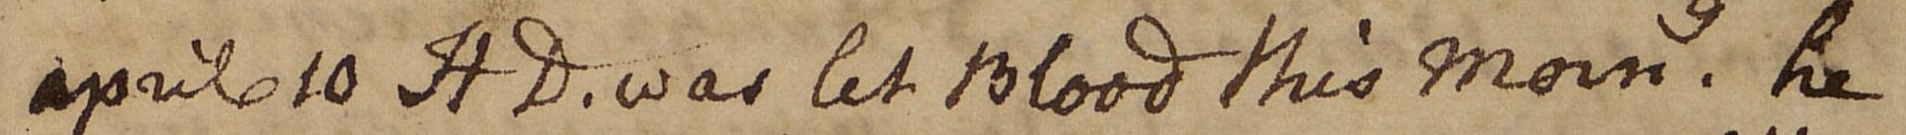April 10 HD. was let Blood this morn^g. he
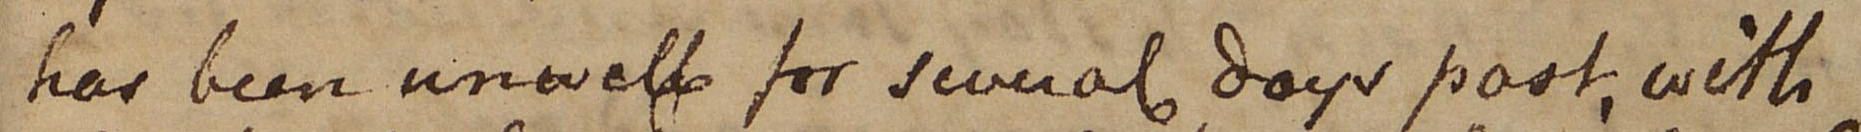has been unwell for several days past, with
